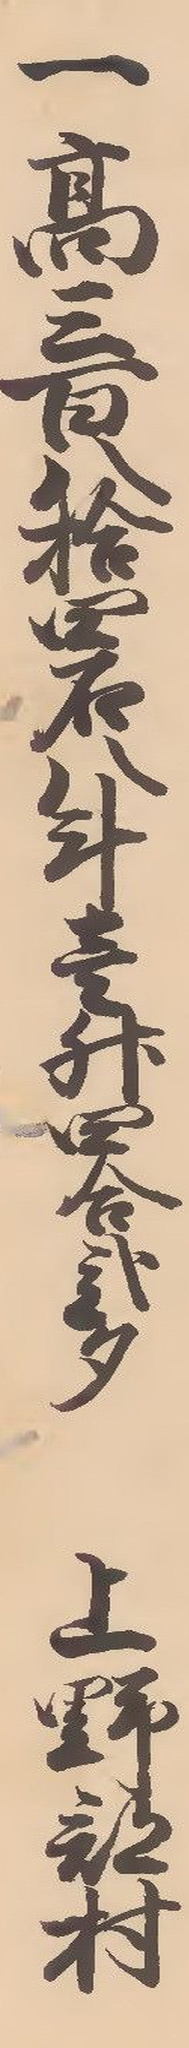一高三百八拾四石八斗壱升四合弐勺上野部村

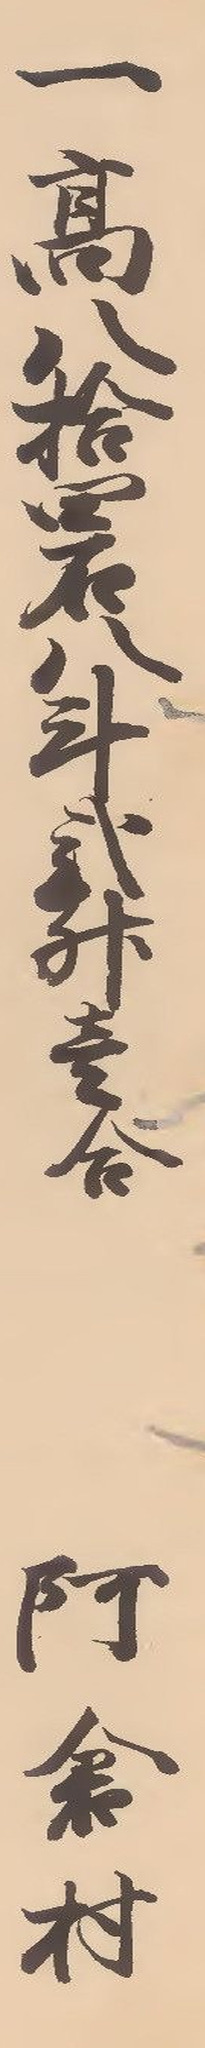一高八拾四石八斗弐升壱合阿倉村
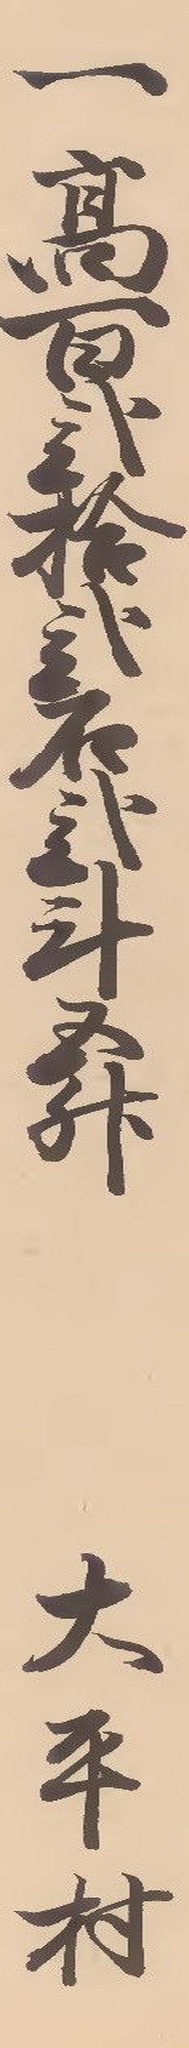一高百弐拾弐石弐斗五升大平村
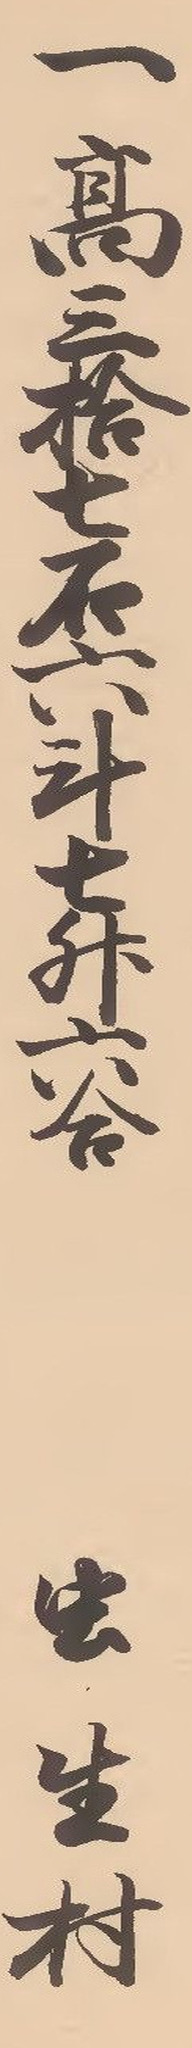一高三拾七石六斗七升六合虫生村
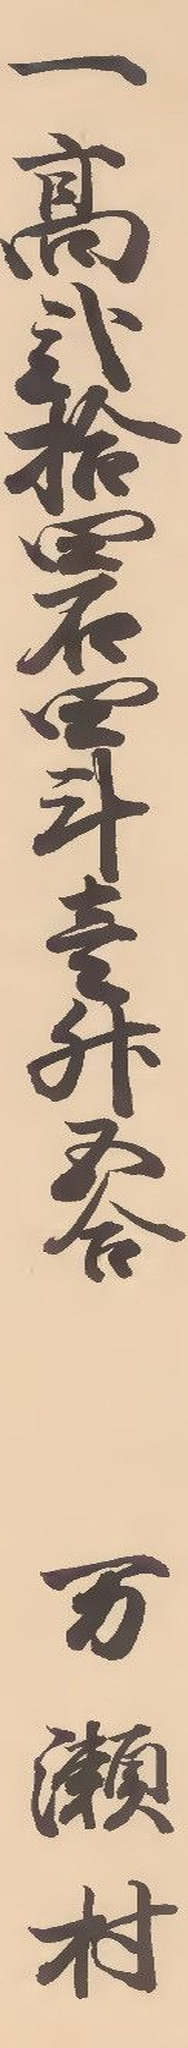一高弐拾四石四斗壱升五合万瀬村
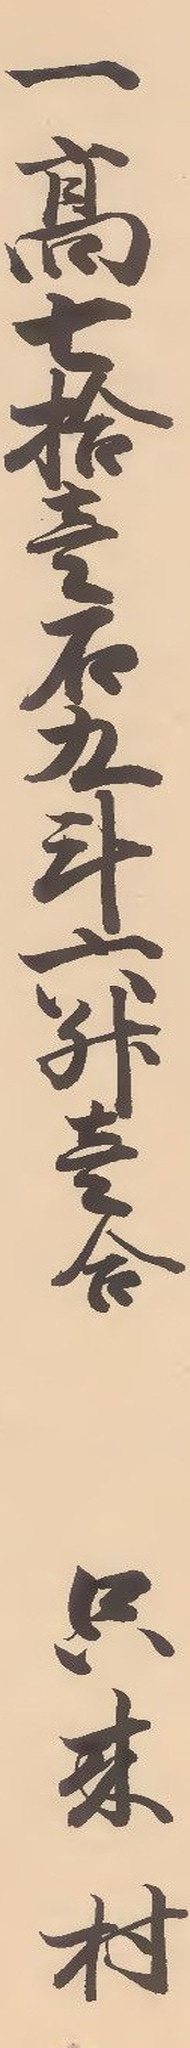一高七拾壱石九斗六升壱合只来村
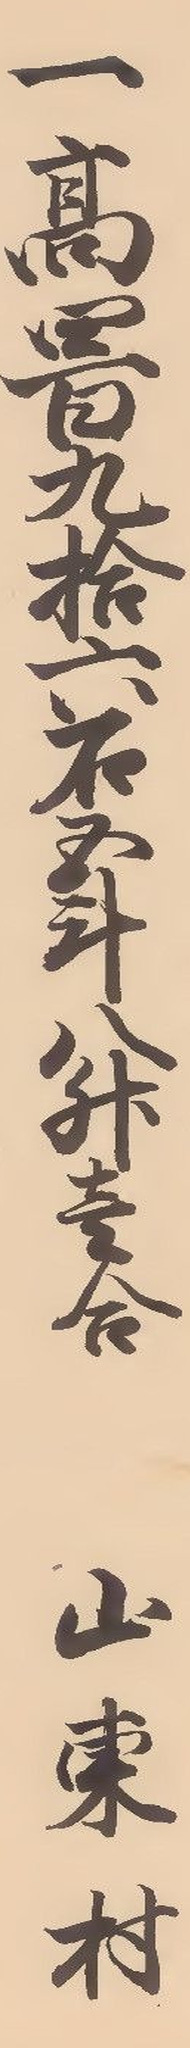一高四百九拾六石五斗八升壱合山東村
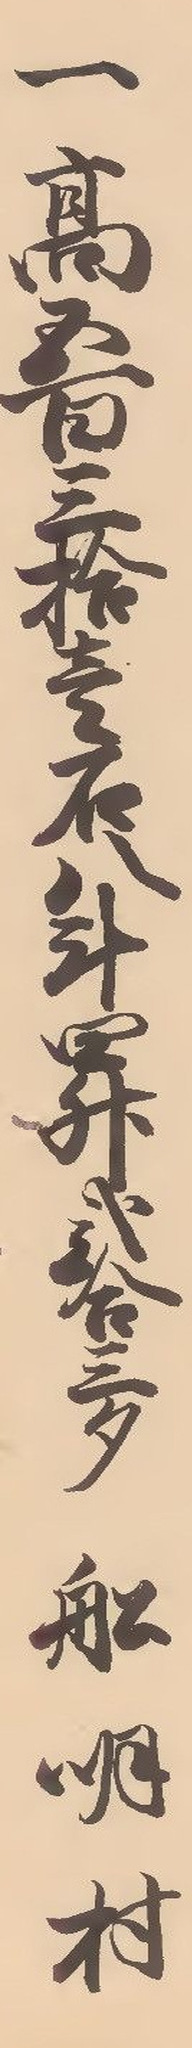一高五百三拾壱石八斗四升弐合三勺船明村

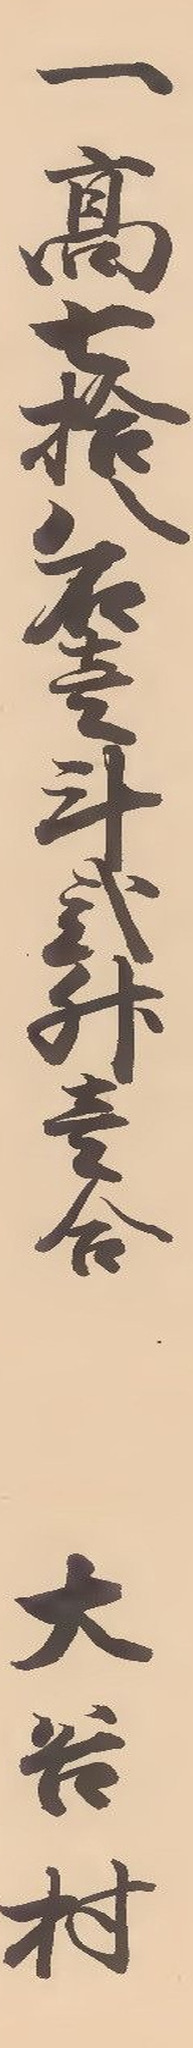一高七拾八石壱斗弐升壱合大谷村
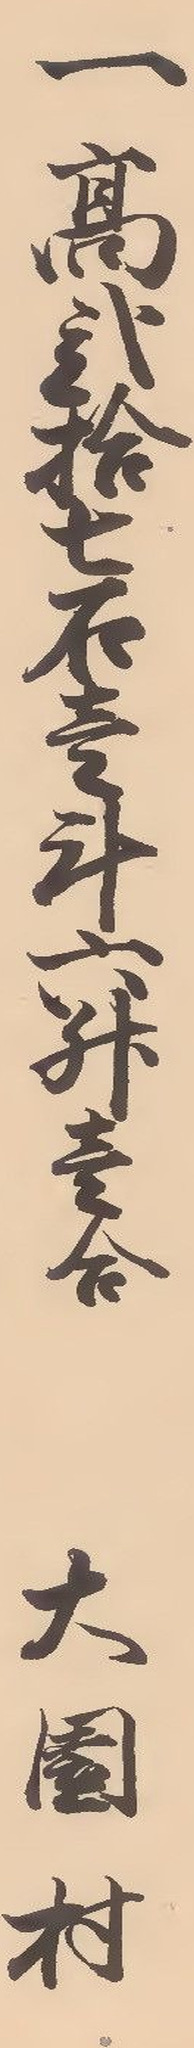一高弐拾七石壱斗六升壱合大園村
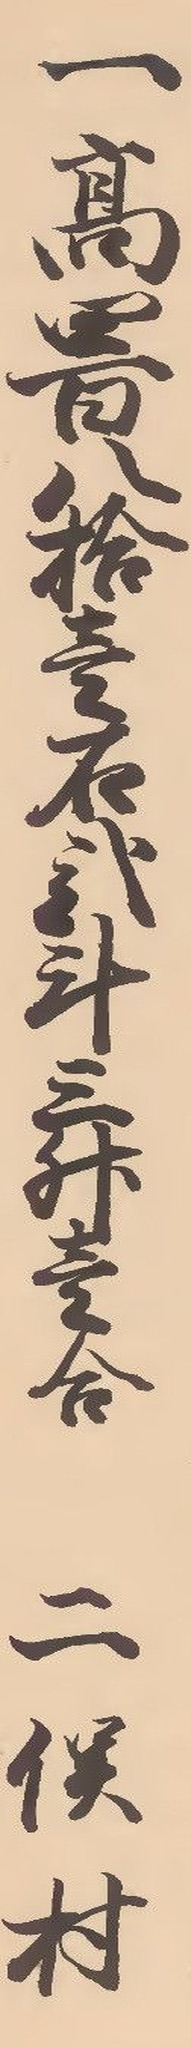一高四百八拾壱石弐斗三升壱合二俣村
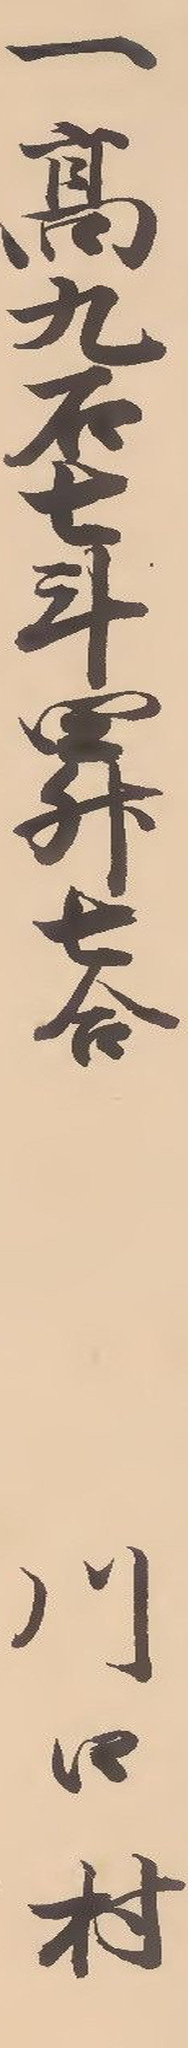一高九石七斗四升七合川口村
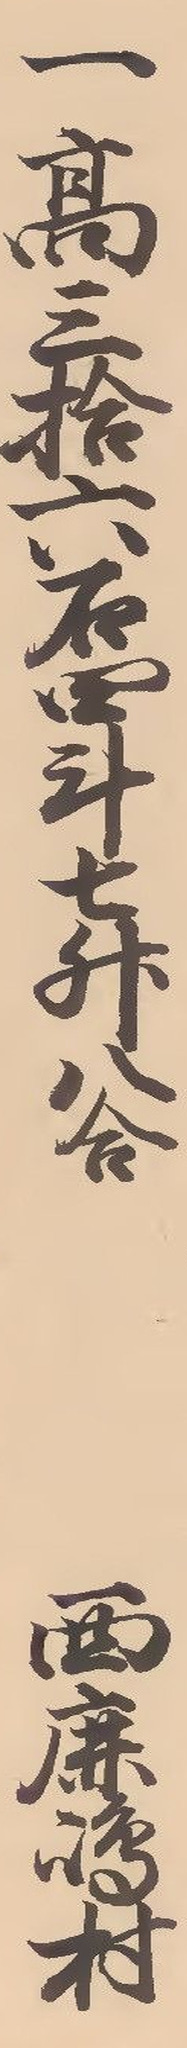一高三拾六石四斗七升八合西鹿島村

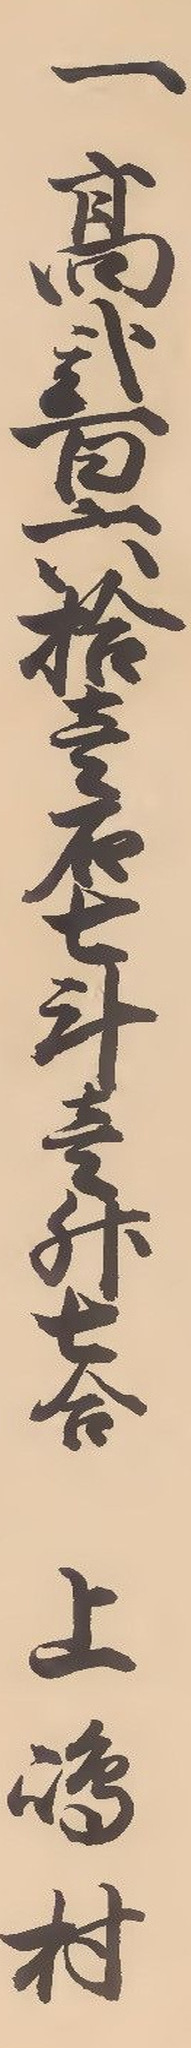一高弐百六拾壱石七斗壱升七合上島村
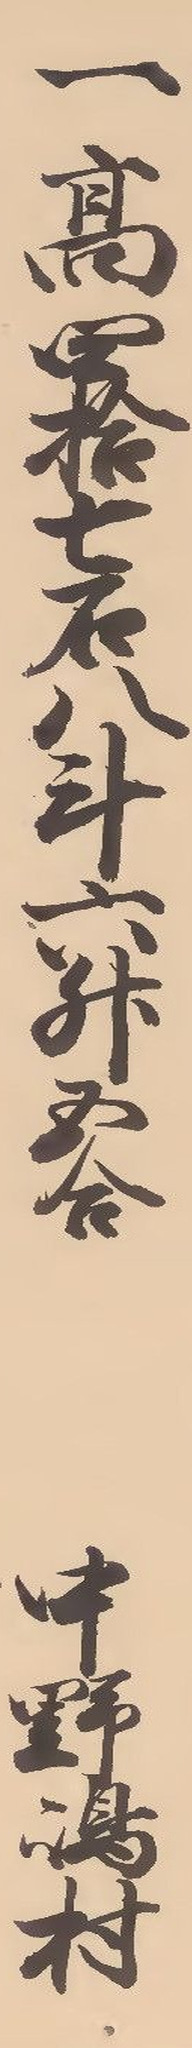一高四拾七石八斗六升五合中野島村
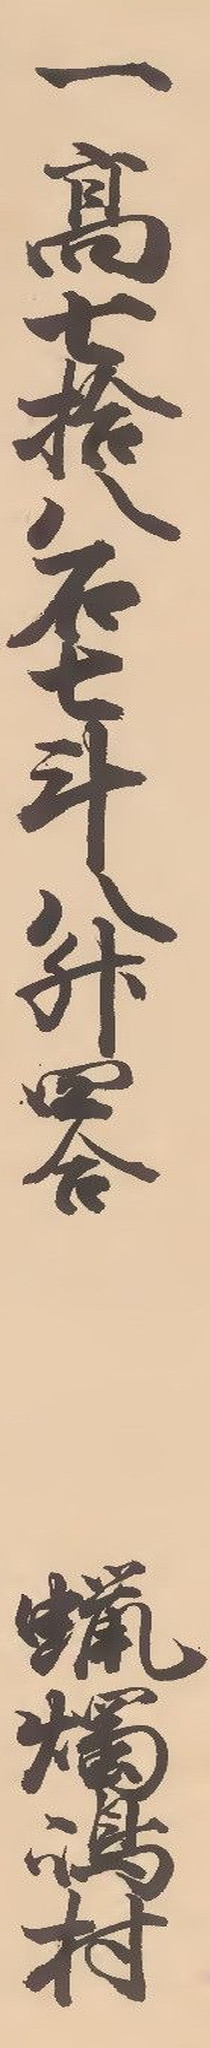一高七拾八石七斗八升四合蝋燭島村
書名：遠江国郷帳
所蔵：国立公文書館 National Archives of Japan
